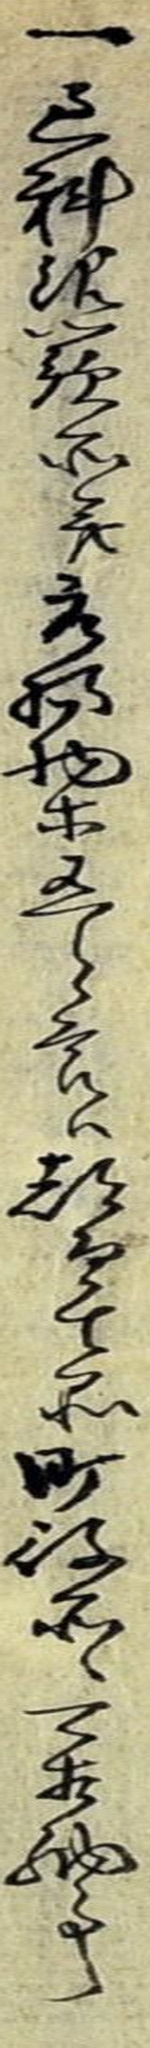一過料銀闕所并取揚物等有之節ハ都而其品町役所へ可相納事
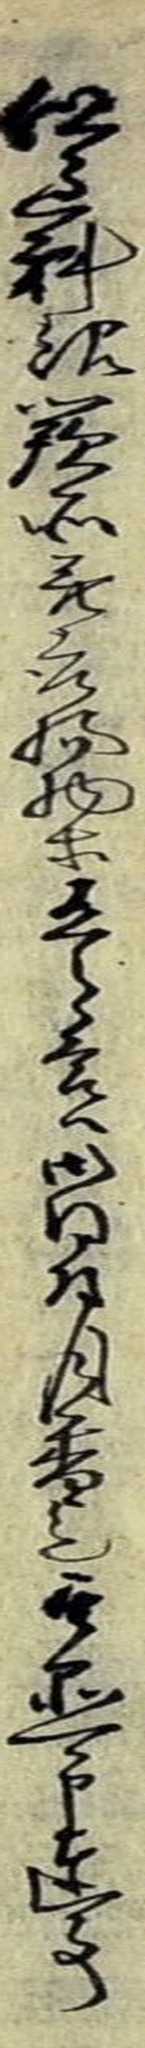但過料銀闕所并取揚物等有之節ハ御目付月番迄其品可申達事
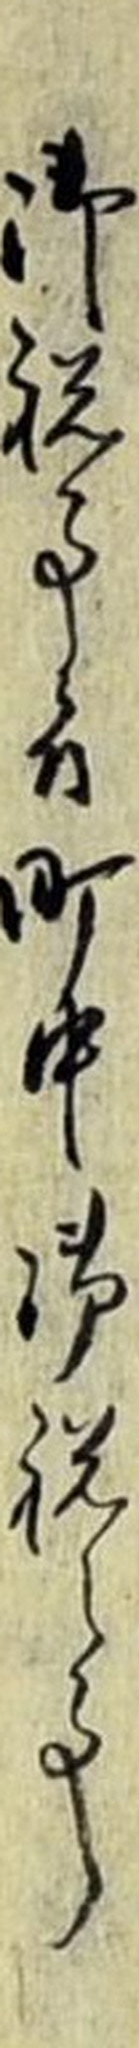御祝事ニ付町中御祝之事
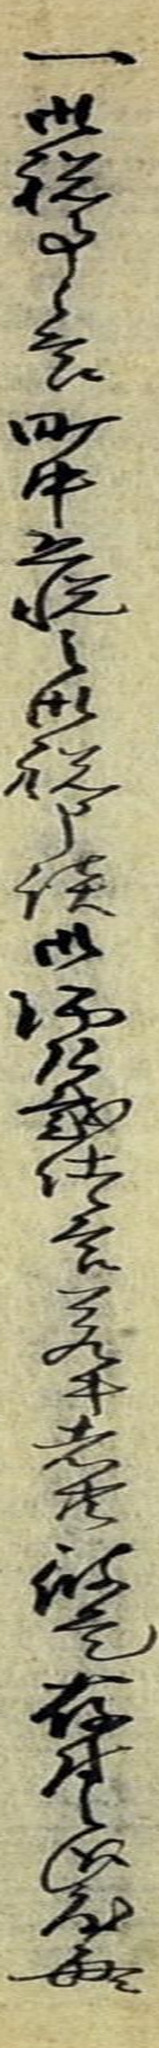一御祝事之節町中恐悦之御祝申談御酒頂戴仕候節若キ者共彼是存付之趣度毎ニ
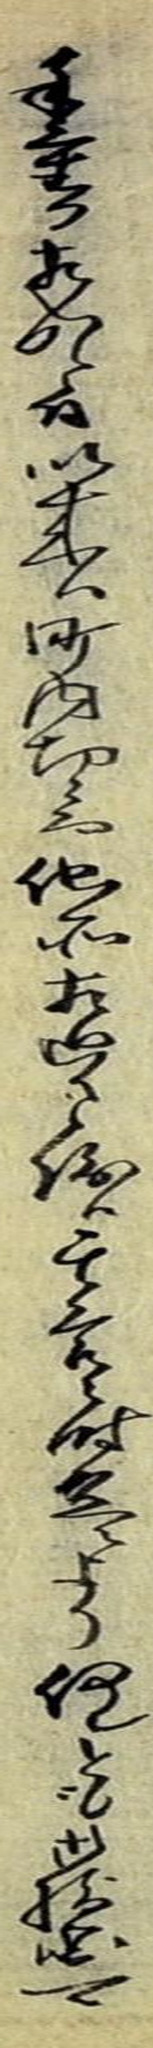手重ク相成候ニ付以来ハ町内切ニ而他所相廻り候儀ハ其節々時宜ニより何レとも御指図可
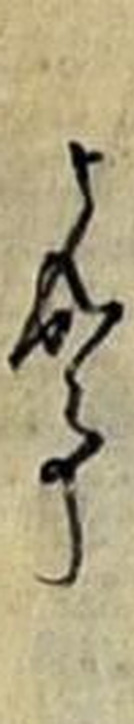被成事
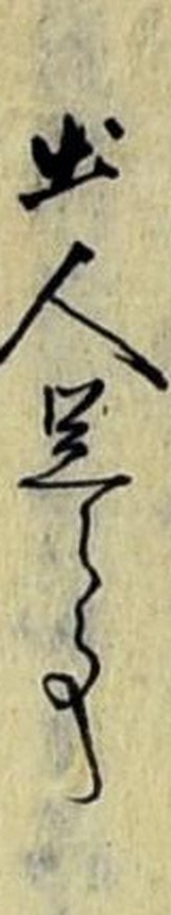出人足之事
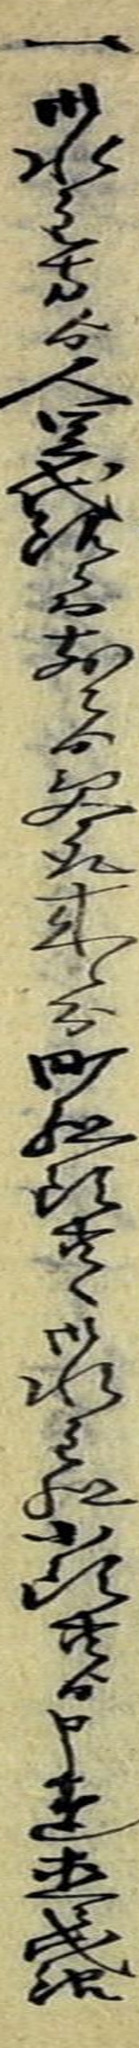一御水主方ゟ人足代銀ニ而前々ゟ受取来候分町組頭共へ御水主組小頭共ゟ申達直ニ代銀
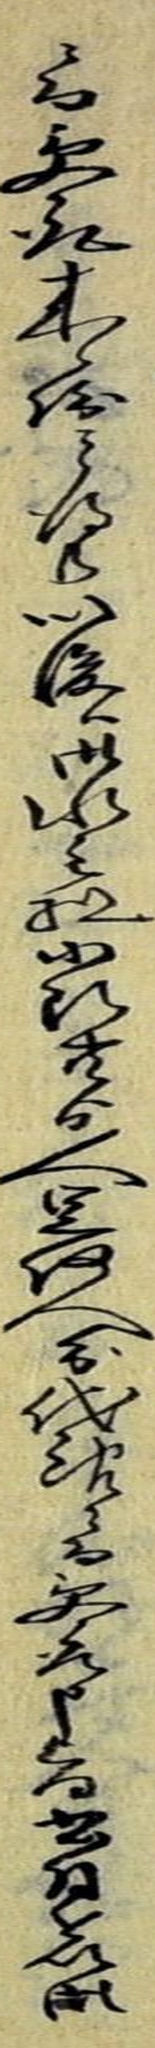ニ而受取来候儀ニ候得共以後ハ御水主組小頭共ゟ人足何人分代銀ニ而受取申旨書付を以御
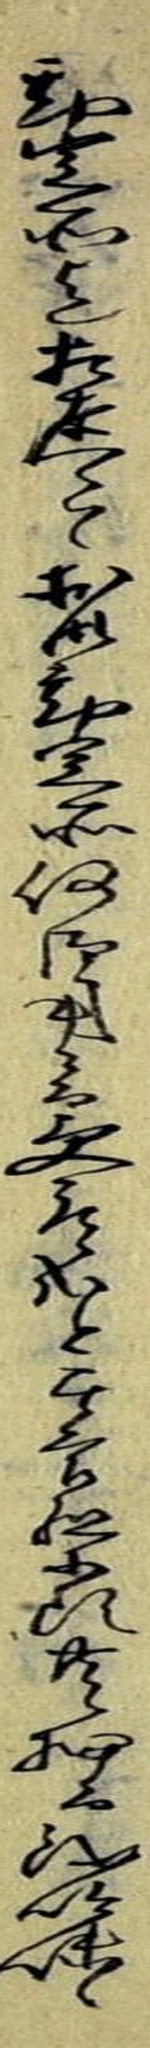勘定所迄相達候ハヽ於御勘定所何御用ニ而受取候哉と其節組小頭共へ押而
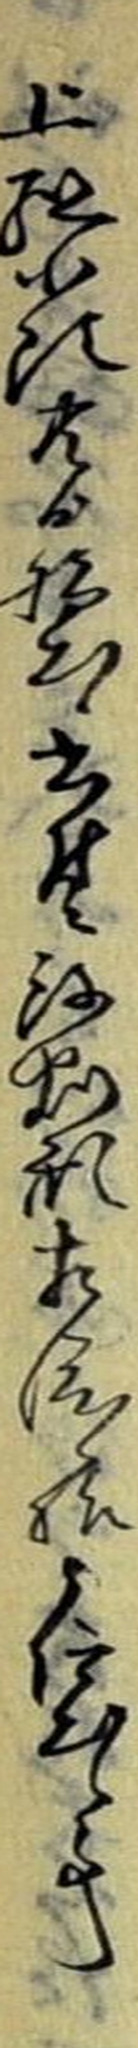上組小頭共ゟ指出候書付ニ致判形相渡候様被仰出候事
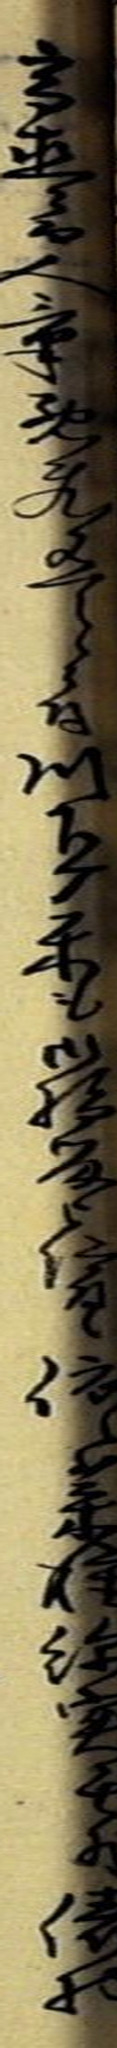高直ニ而人気悪敷有之ニ付川下ケ米も御指留被仰付候依之薬種綿実其外俵物
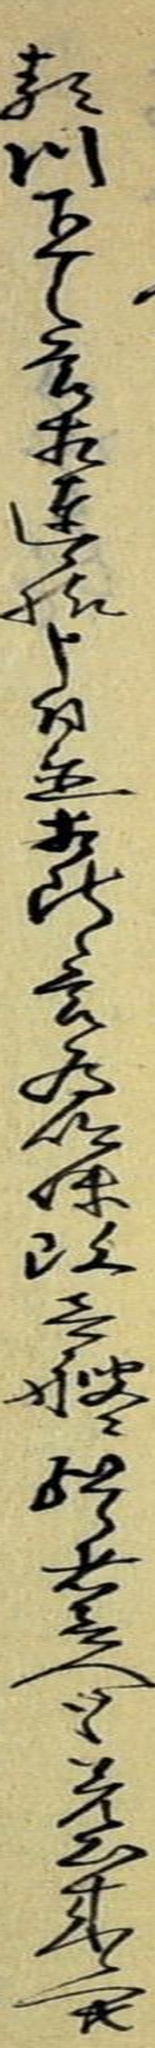類川下ケ之節相達候様申付置相断候節為吟味改壱艘ニ組之者壱人ツヽ差出来候へ共
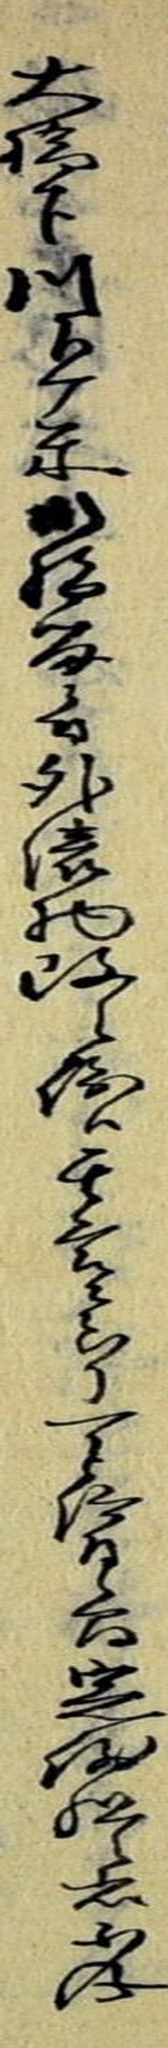大橋下川下ケ米御指留ニ付外俵物改之儀ハ其節ニ至り可被仰付候間定例組之者不及
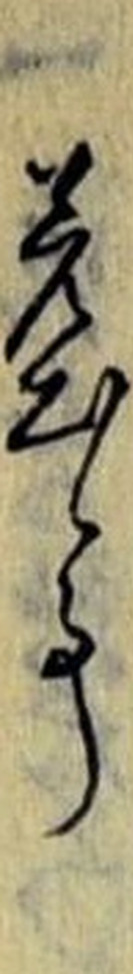差出候事
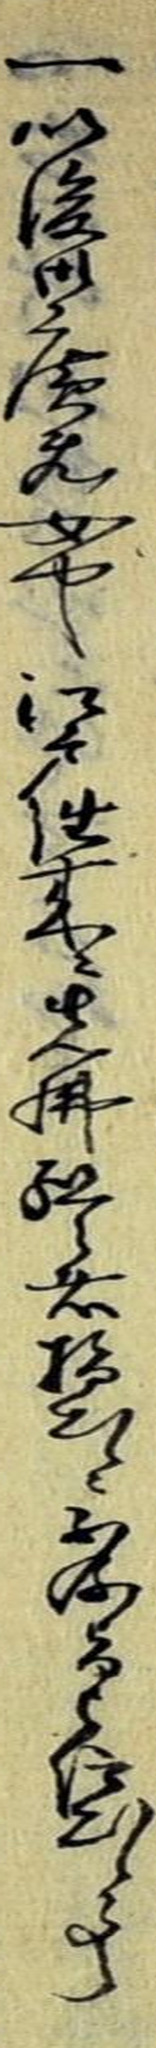一以後御広敷女中江戸往来ニ先払組之者指出候ニ不及旨被仰出候事
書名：命令之部 三
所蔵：福井県文書館 Fukui Prefectural Archives
